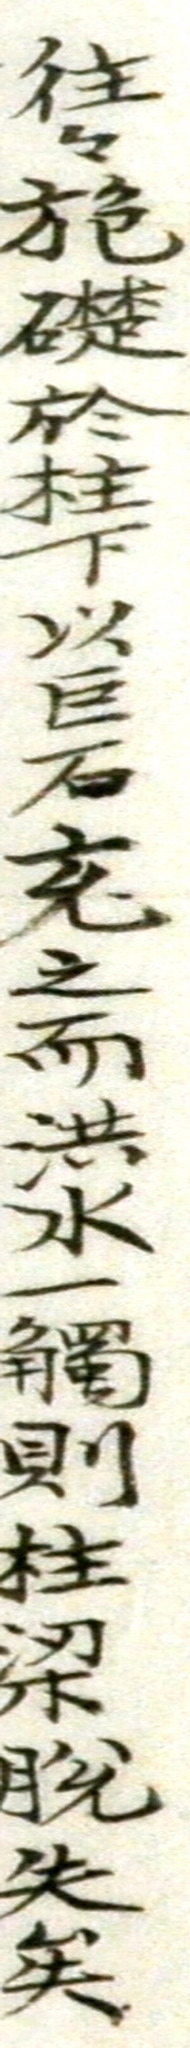往々施礎於柱下以巨石充之而洪水一触則柱梁脱失矣
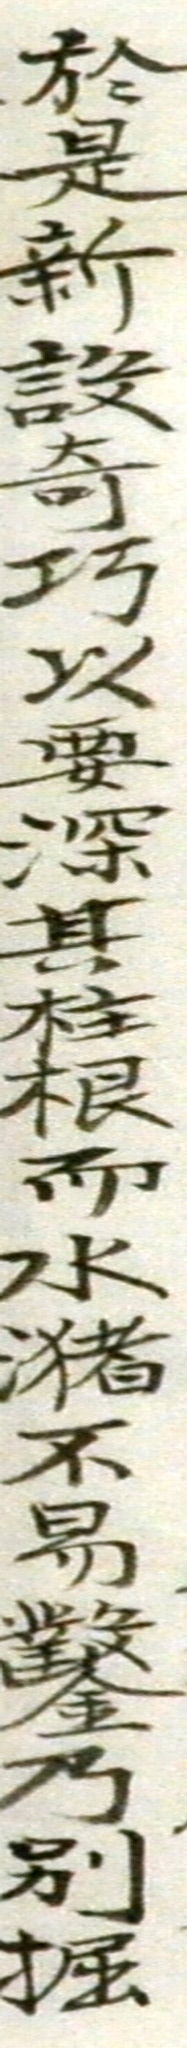於是新設奇巧以要深其柱根而水潴不易鑿乃別掘
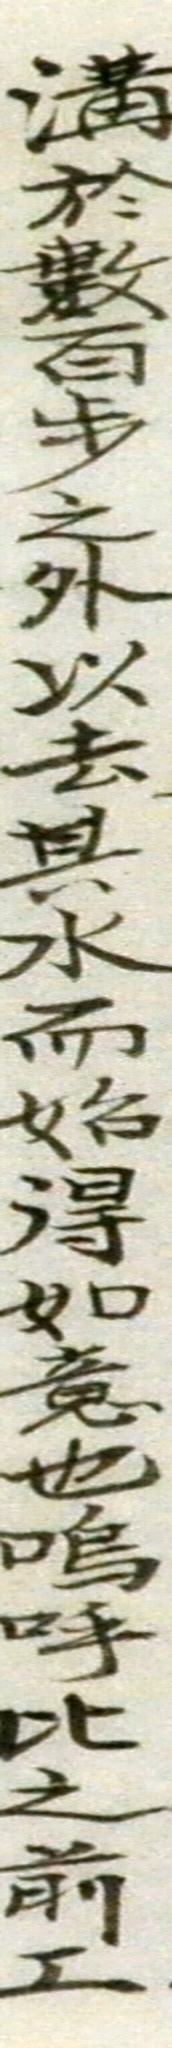溝於数里歩之外以去其水而始得如意也嗚呼比之前工
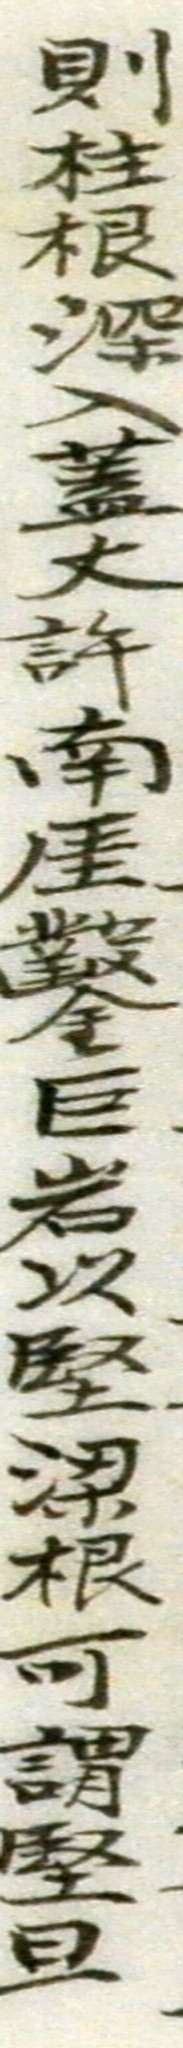則柱根深入蓋大許南厓鑿巨岩以堅梁根可謂堅且
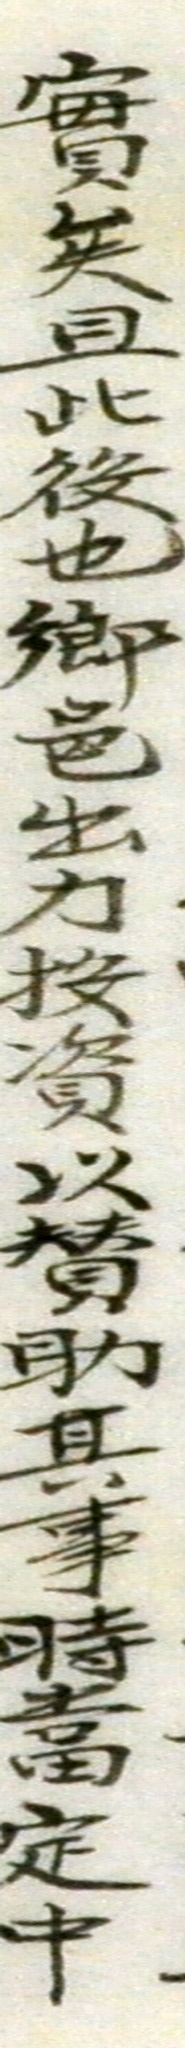実矣且此後也郷邑出力投資以賛助其事時当定中
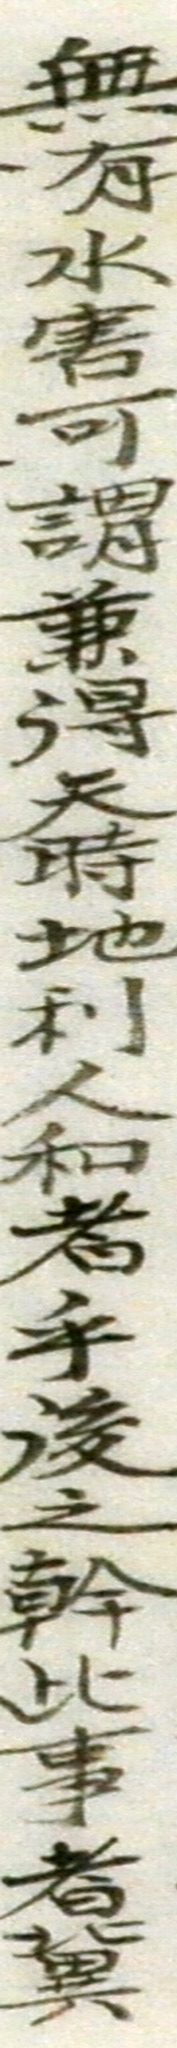無有水害可謂兼得天時地利人和者乎後之幹此事者冀
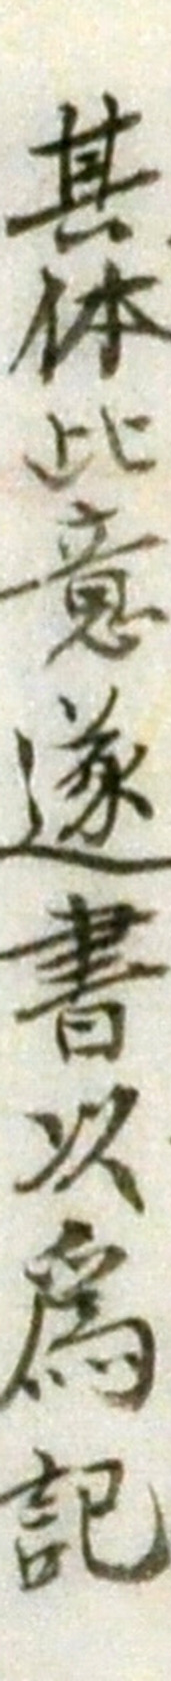其体此意遂書以為記
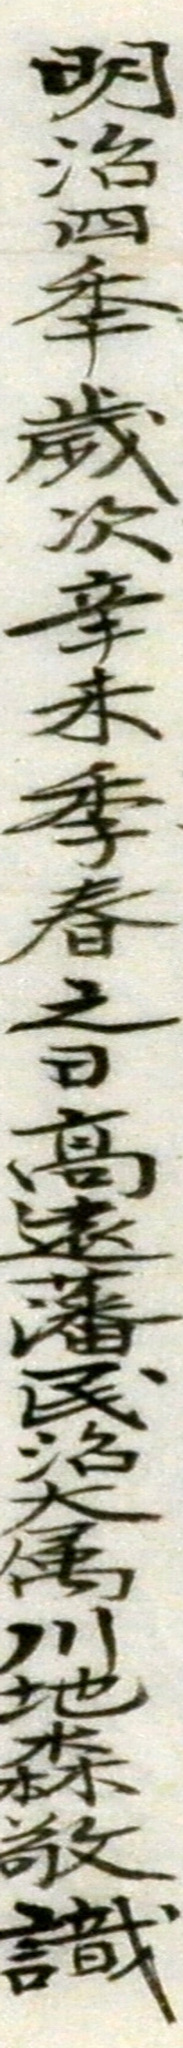明治四季歳次辛未季春之日高遠藩民治大属川地森敬識
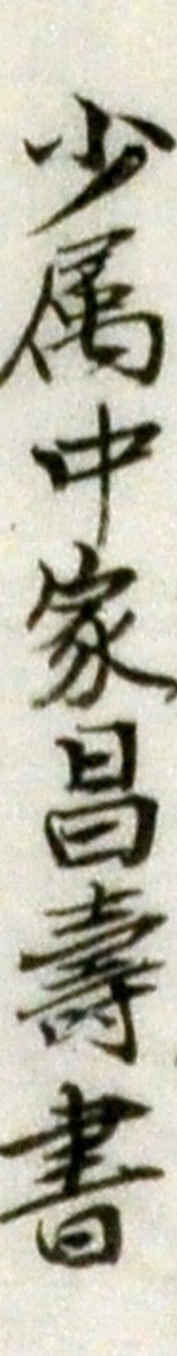少属中家昌寿書
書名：番匠村ノ記、天女橋ノ記
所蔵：伊那市立高遠町図書館・合同会社AMANE
